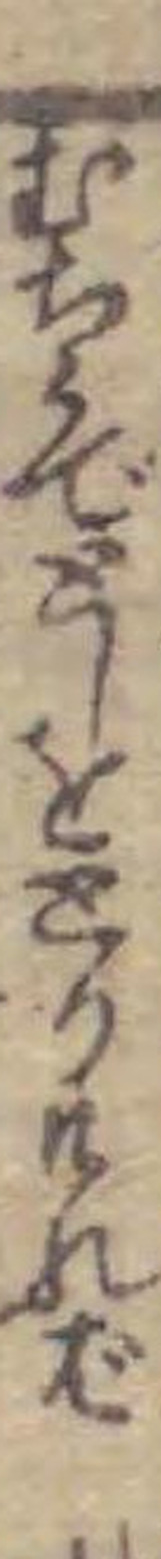むちうでとしをとりければ
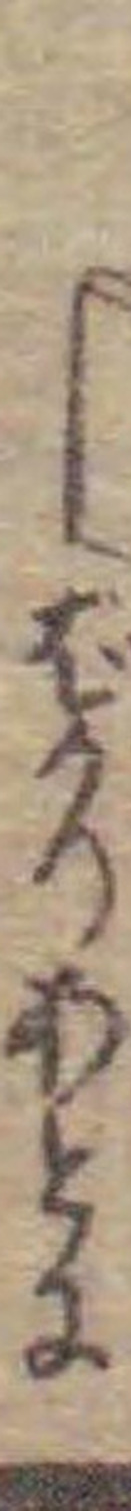ばかりあとに
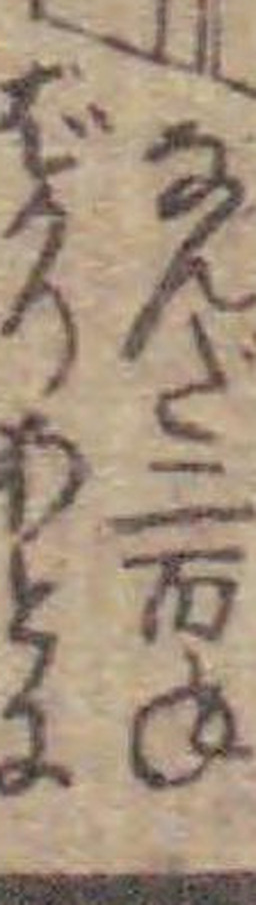ばかりあとに
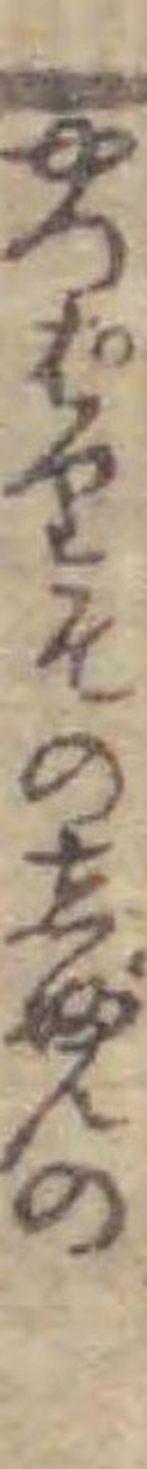やつぱりそのしぶんの
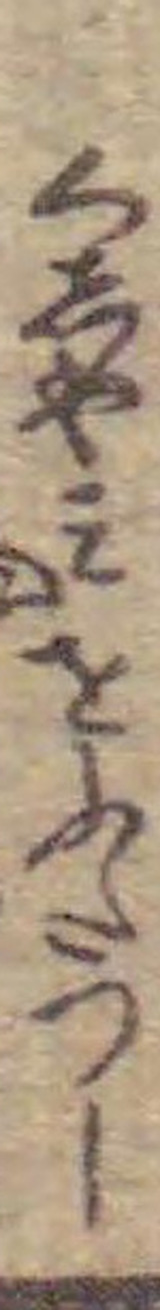くしやみをふたつし
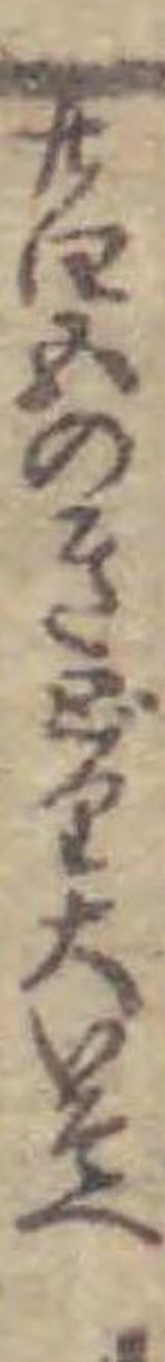廿四五のきどり大いそへ
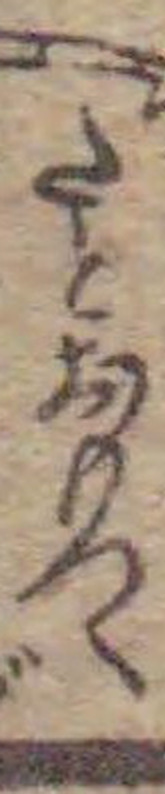たとおもつゝ
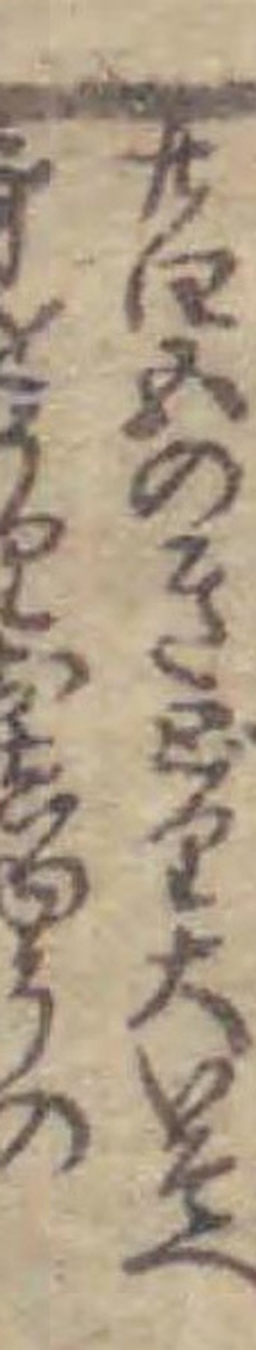身をうりおしゆうの
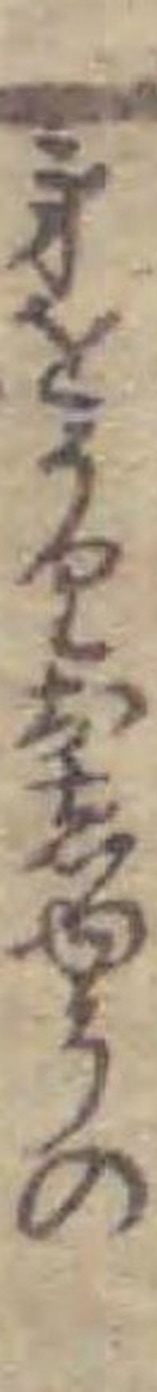身をうりおしゆうの
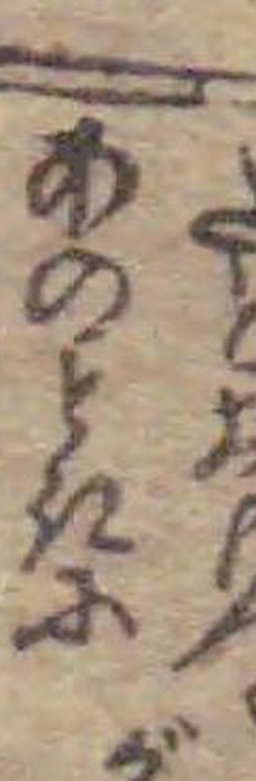あのときに
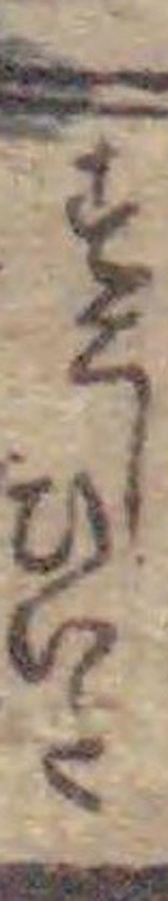すこしひいた
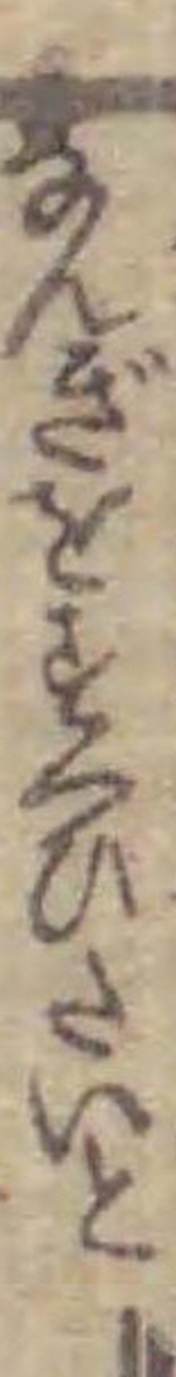なんぎをすくひたいと
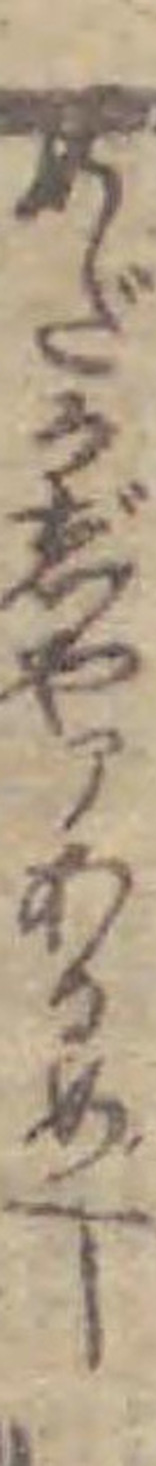めだかじや
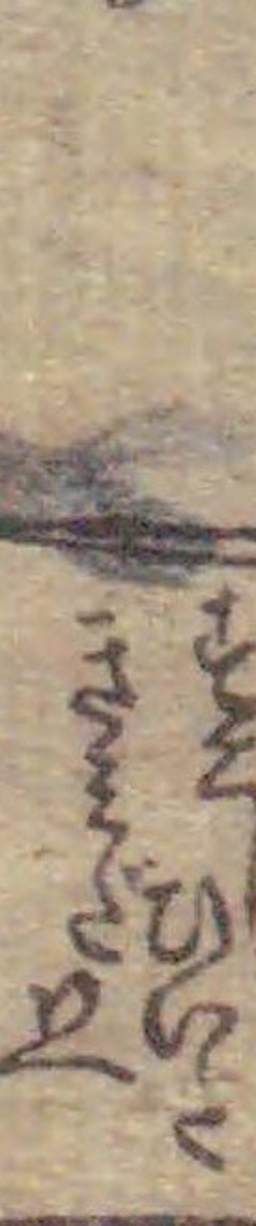きみだわへ
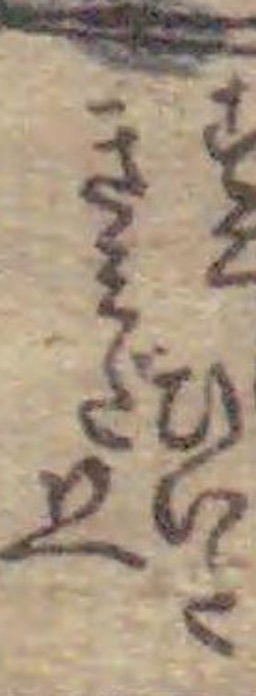きみだわへ
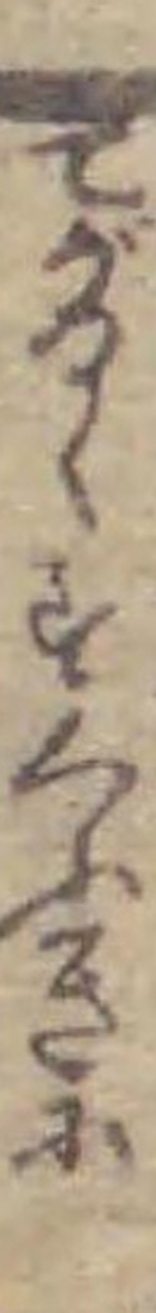てがるくすくふきに
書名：年寄之冷水曽我 : 3巻
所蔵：国立国会図書館 National Diet Library, JAPAN
